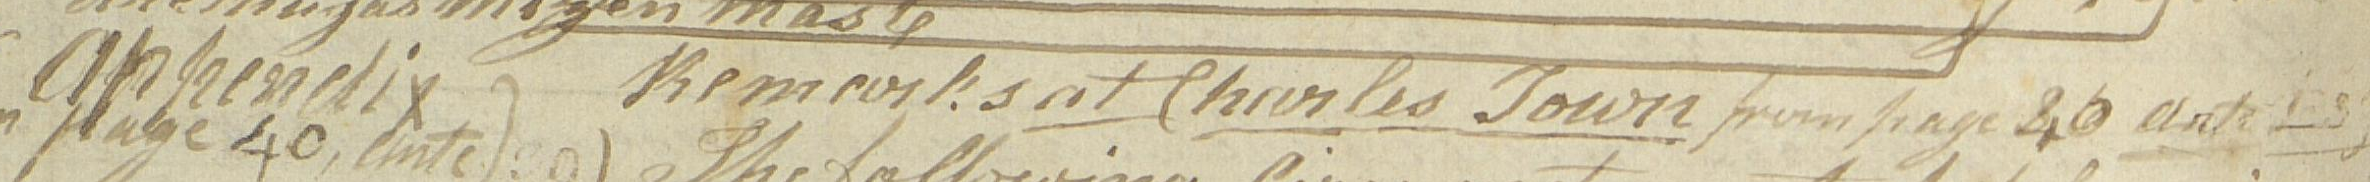Appendix Remarks at Charles Town from page 40 ante
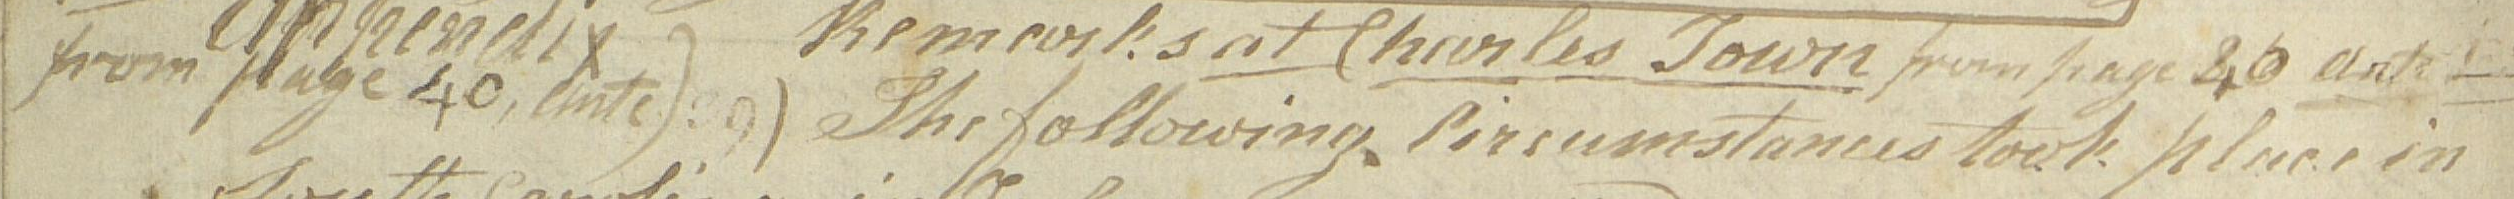from page 40, ante) The following Circumstances took place in
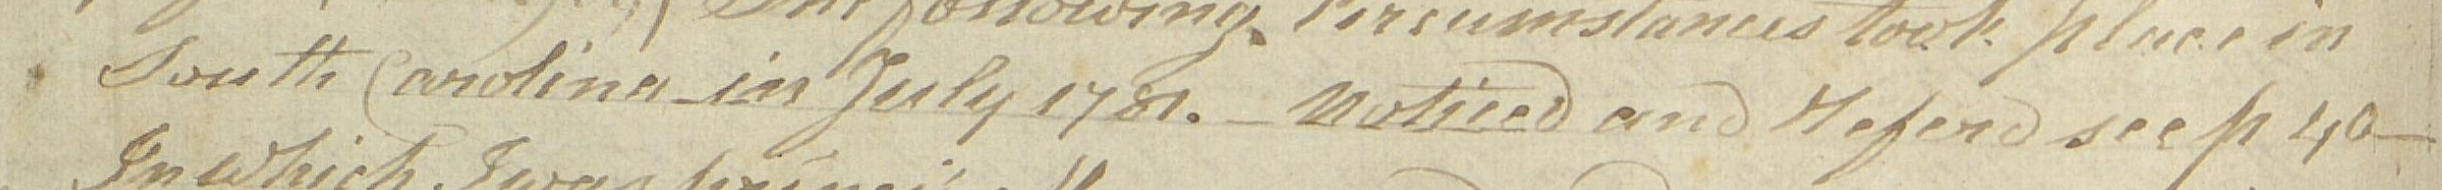South Carolina in July 1787. noticed and referd seep 40
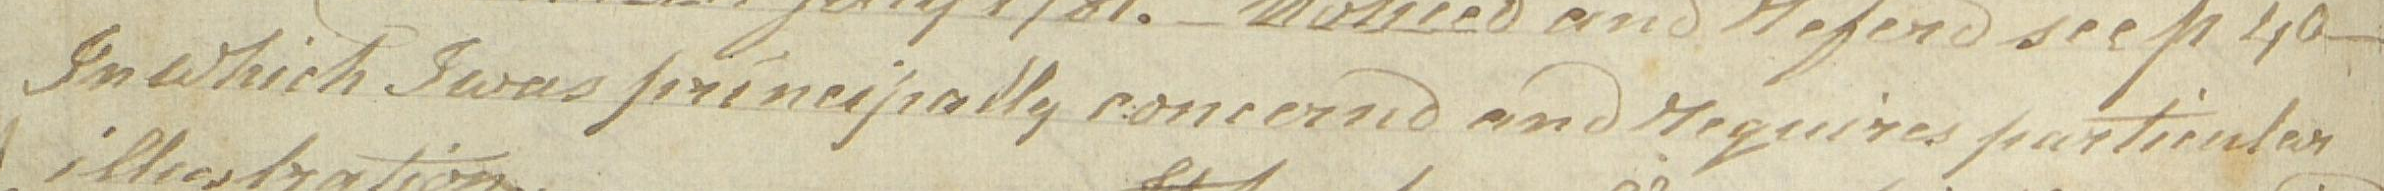In which I was principally concerned and requires particular
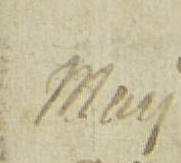May
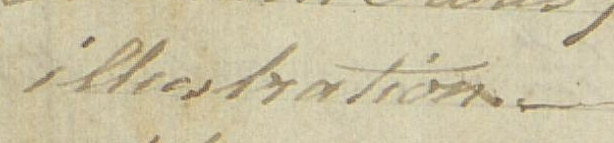illustration
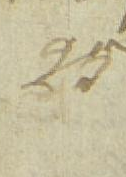25
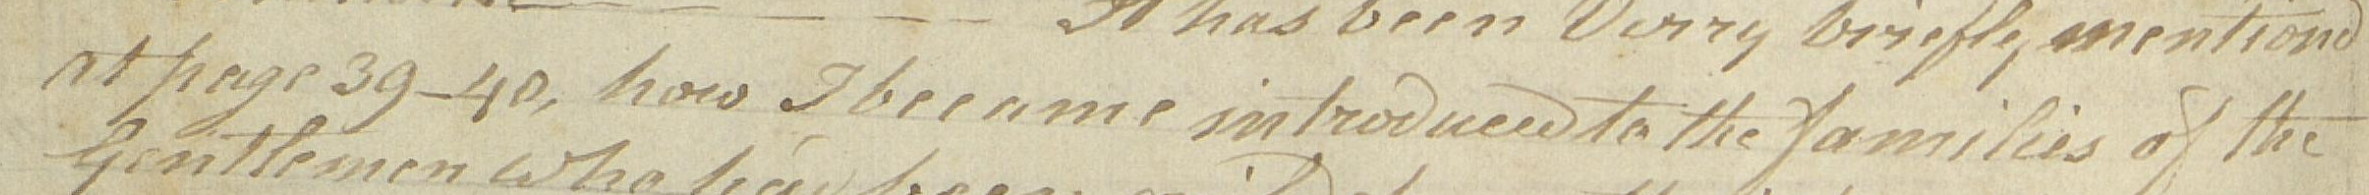at page 39-40, how I became introduce to the families of the
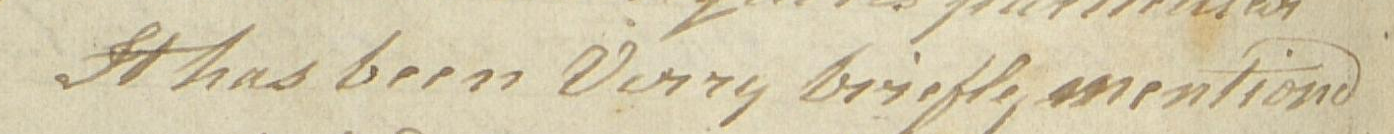It has been Verry briefly mentiond
